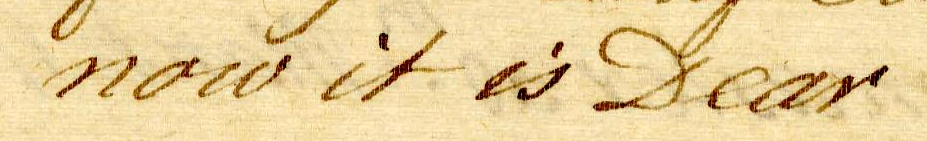now it is Dear
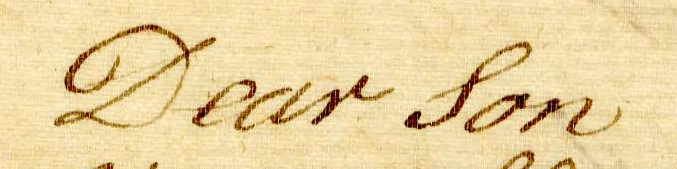Dear Son
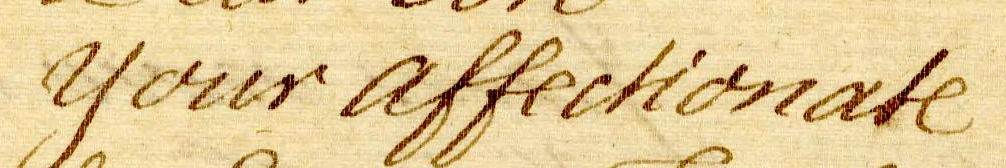Your Affectionate
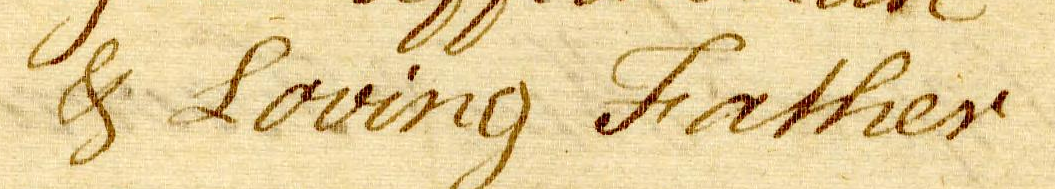& Loving Father
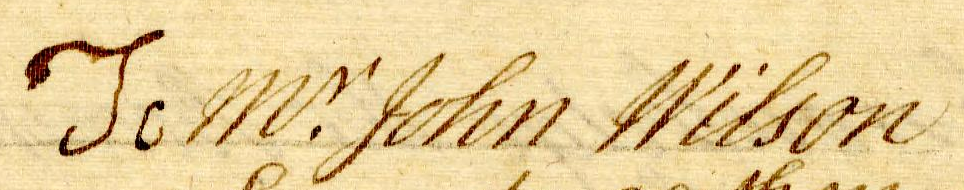To M^r. John Wilson
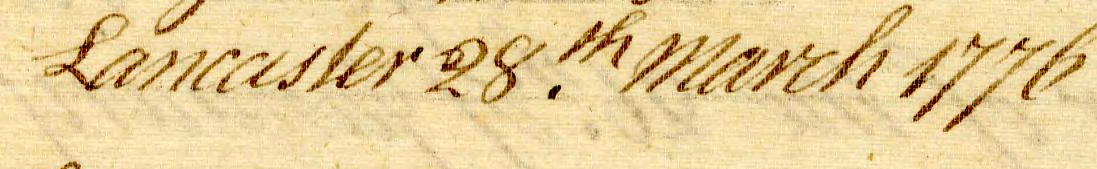Lancaster 28^th. March 1776
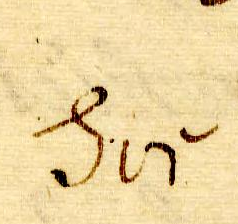Sir
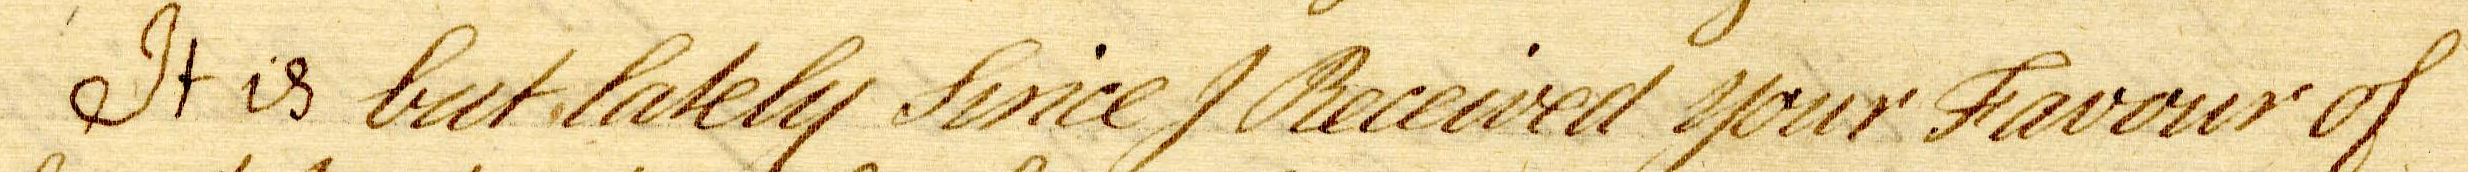It is but lately Since I Received your Favour of
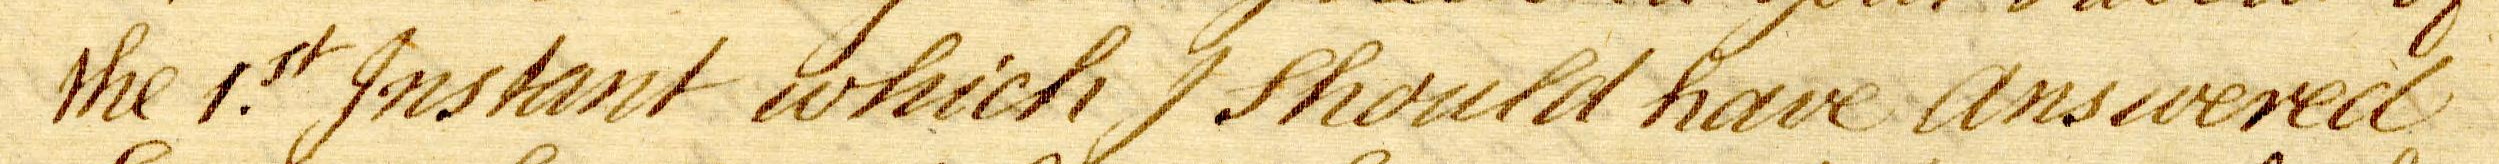the 1.^st Instant which I Should have Answered
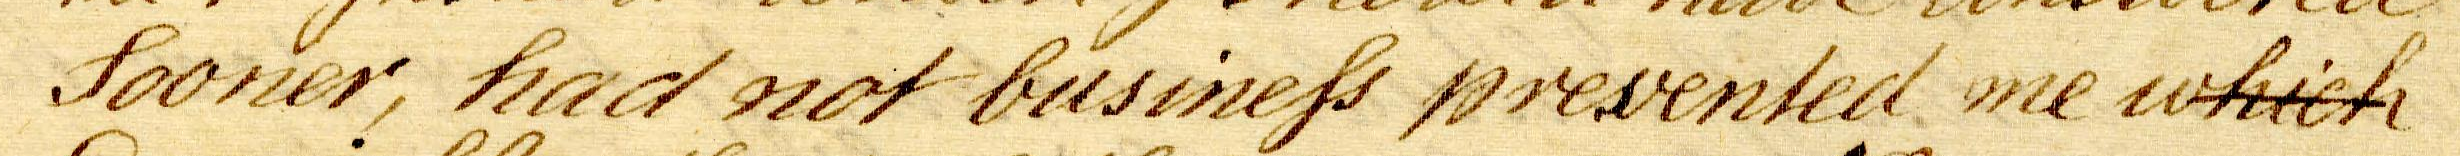Sooner; had not business prevented me [which]
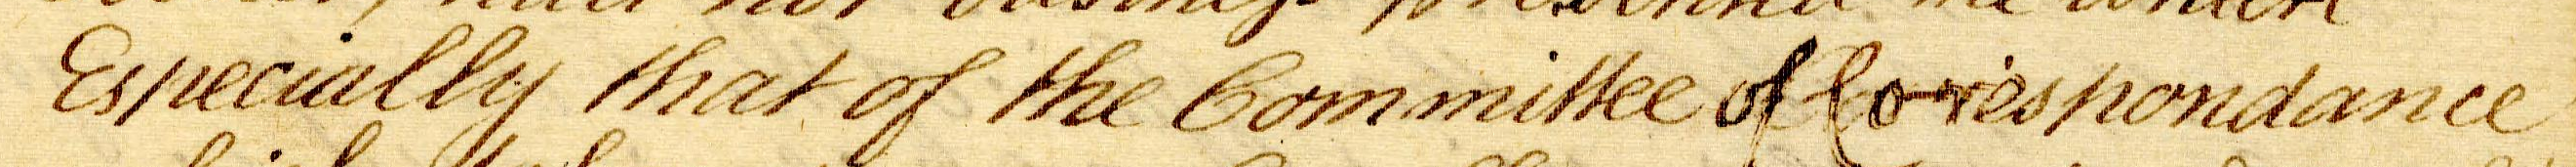Especially that of the Committee of Corespondance
